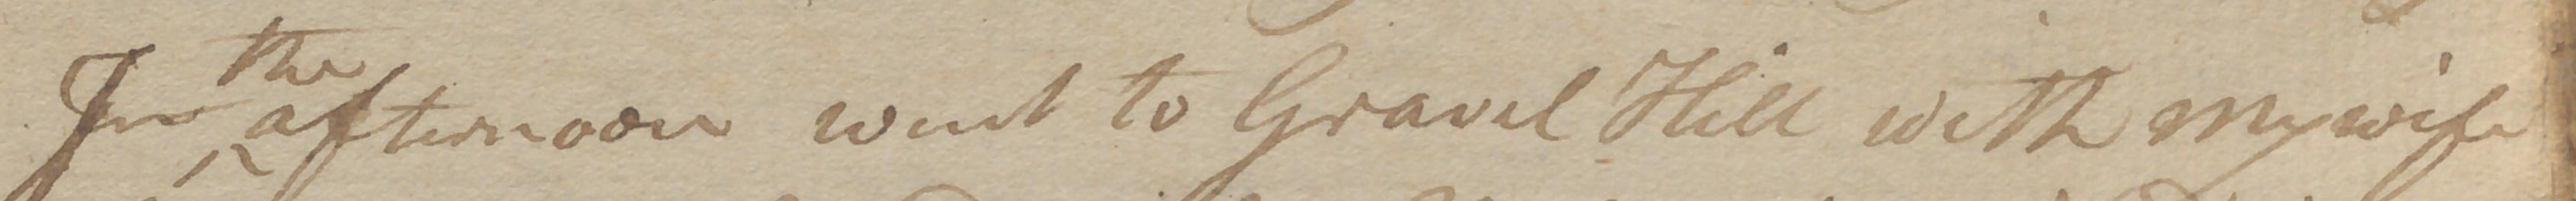In ^the afternoon went to Gravel Hill with my wife
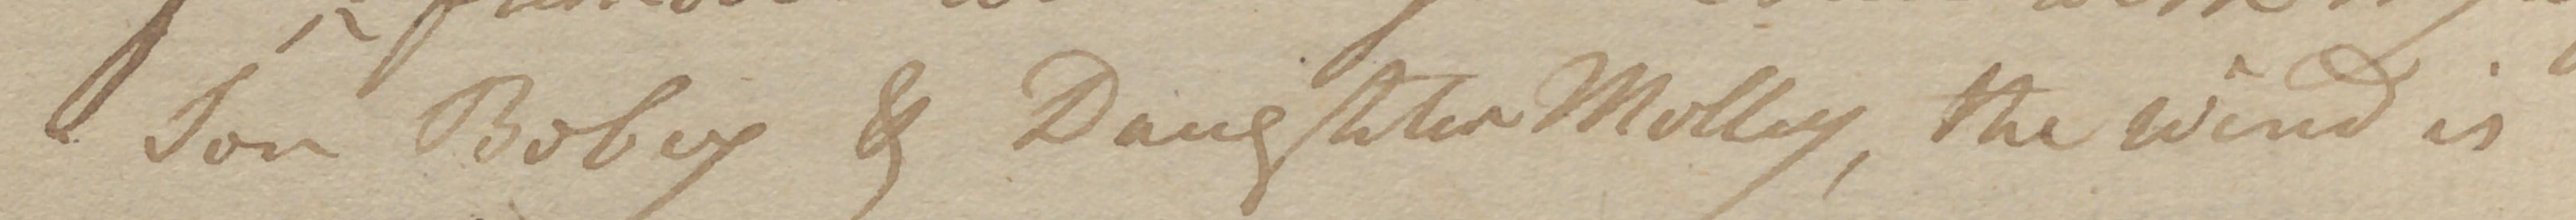Son Bobey & Daughter Molley, the wind is
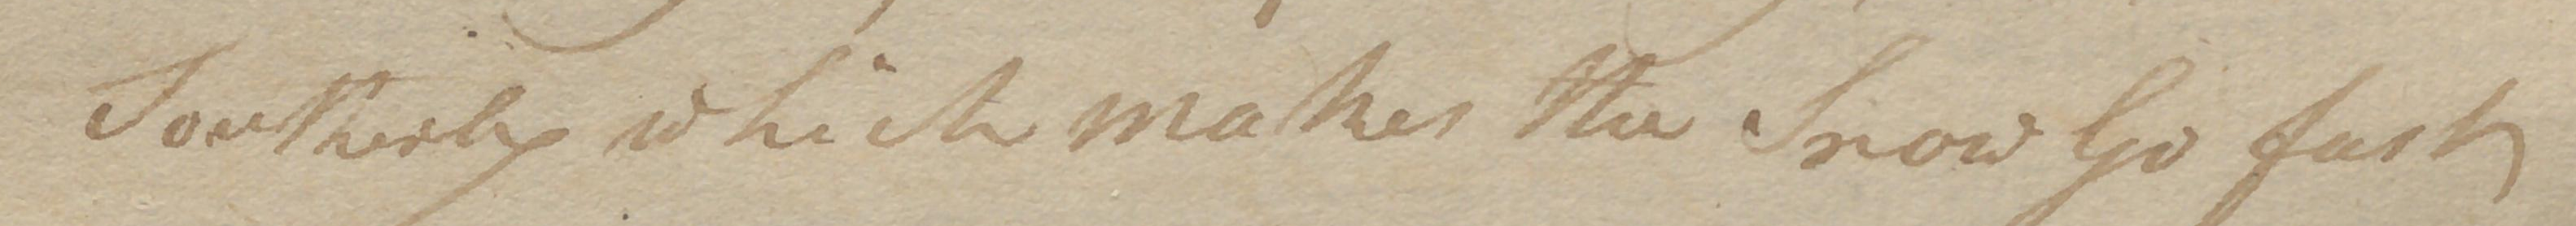southerly which makes the snow Go fast
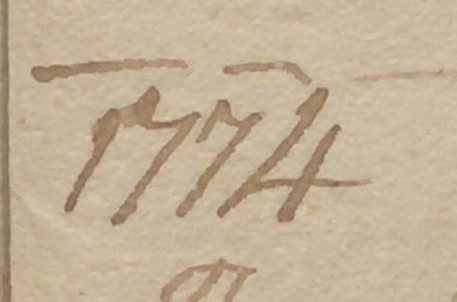1774
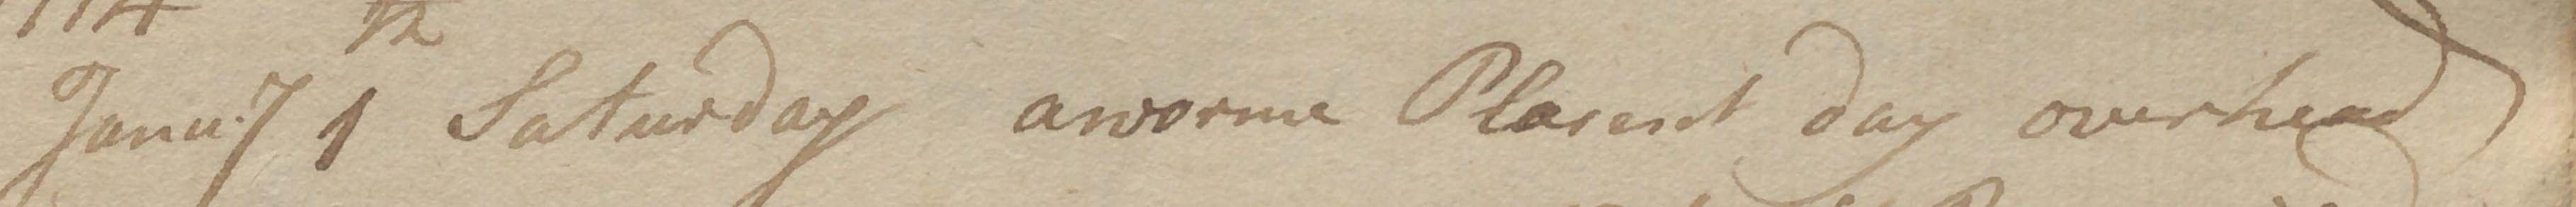Janu^y. 1^th Saturday a worme Plasent day overhead
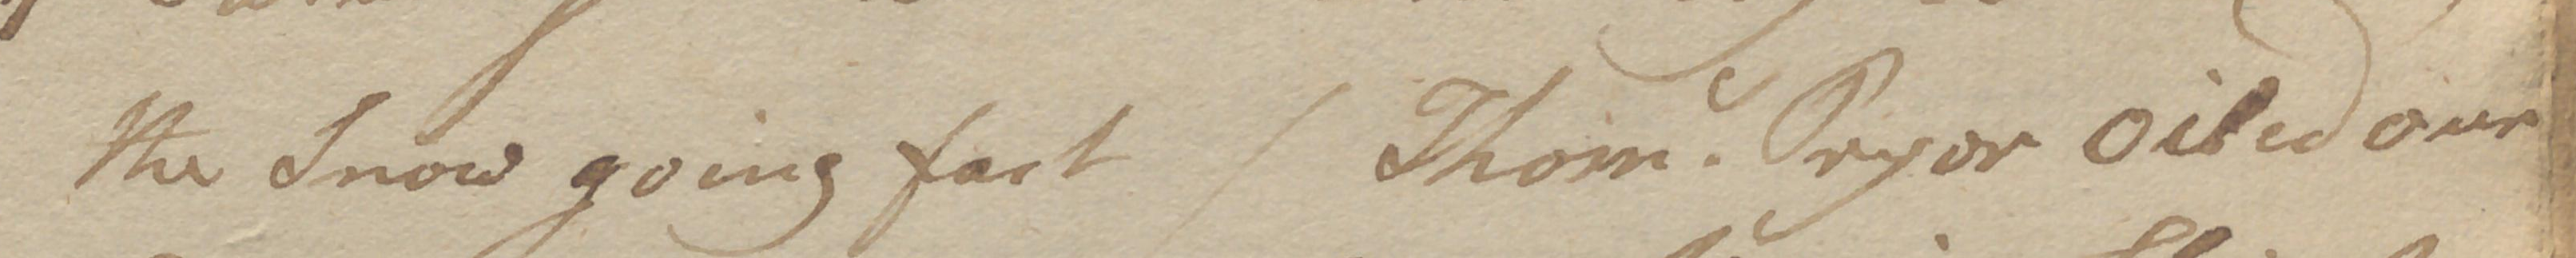the snow going fast Thom. Pryor oiled our
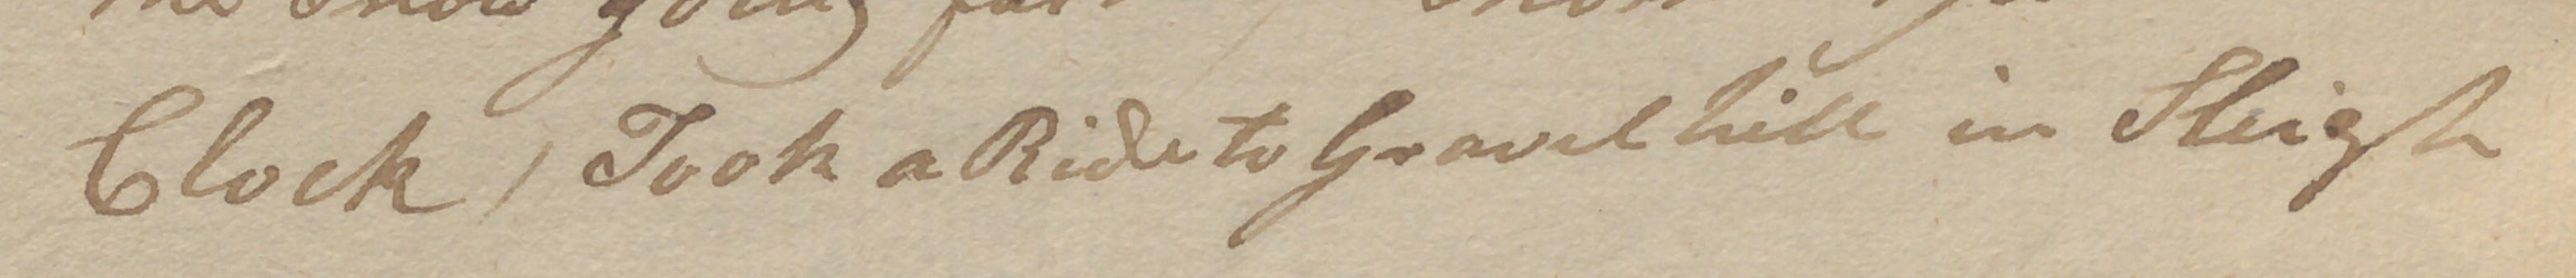Clock, Took a Ride to Gravel hill in Sleigh
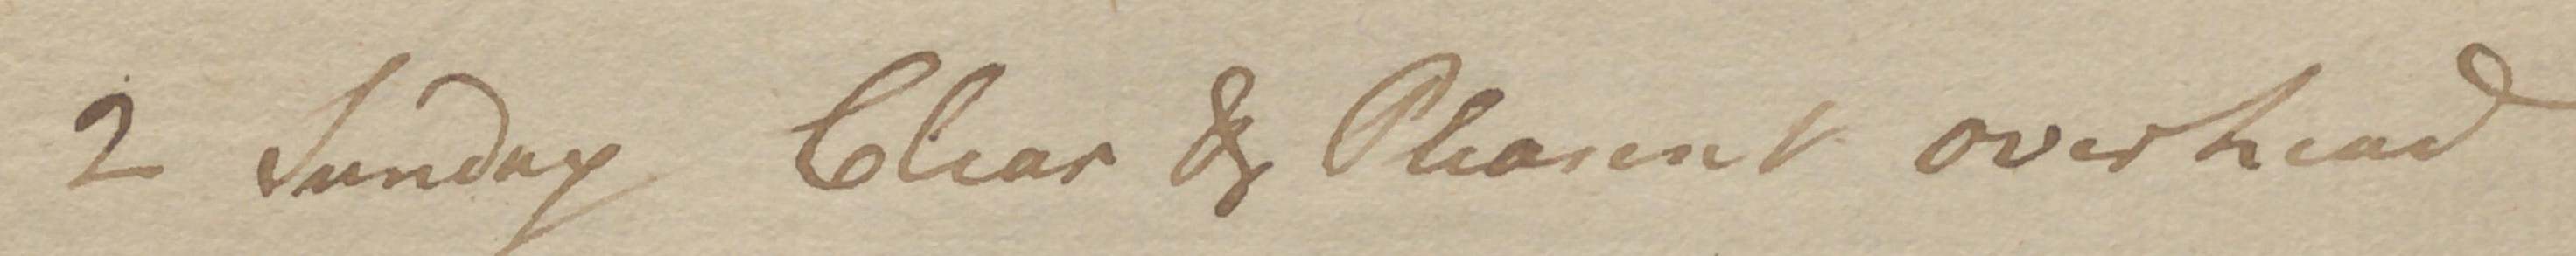2 Sunday Clear & Pleasent overhead
